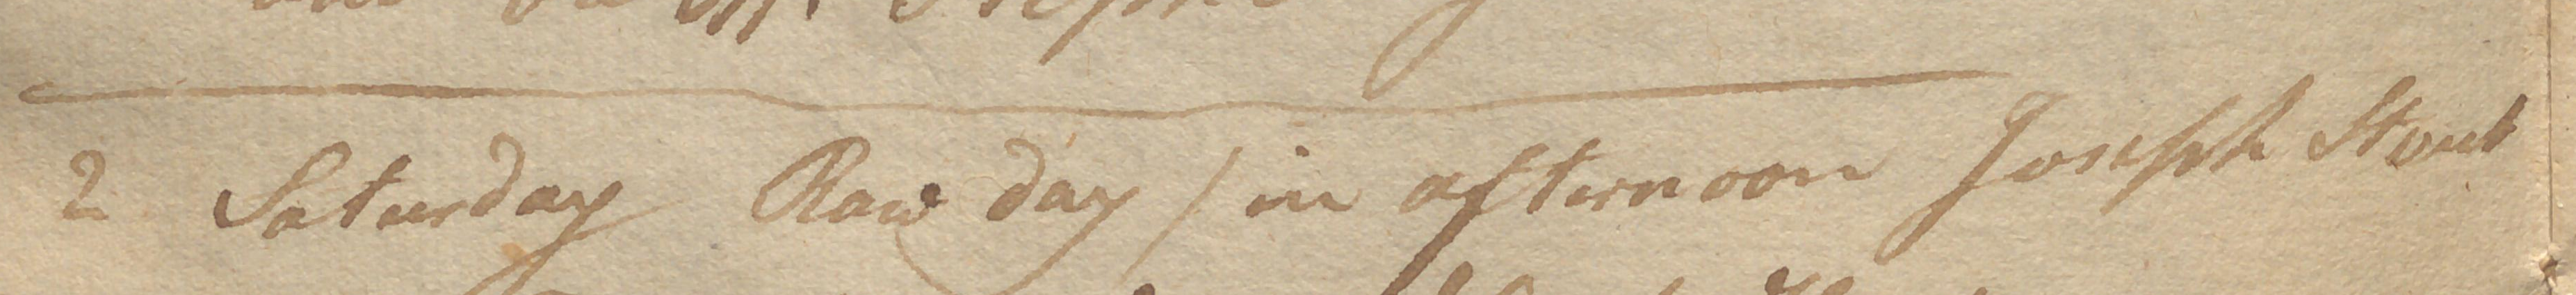2 Saturday Raw day / in afternoon Joseph Stout
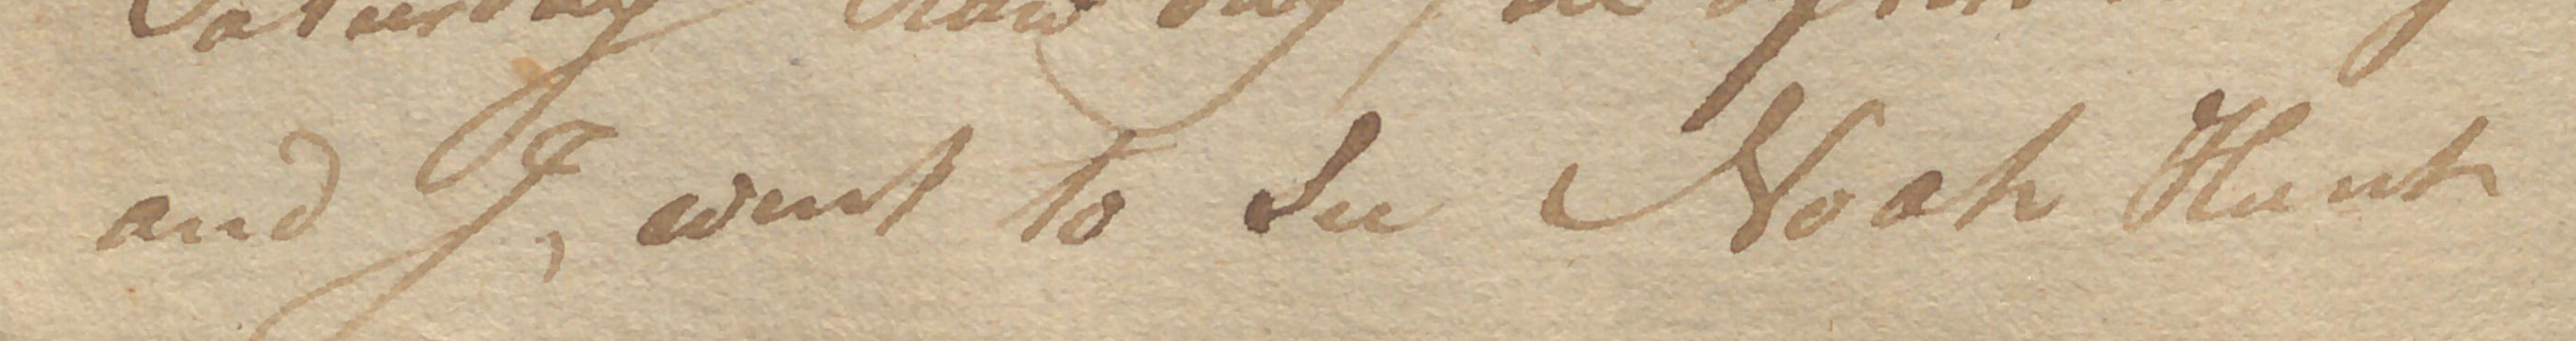and I went to See Noah Hunt
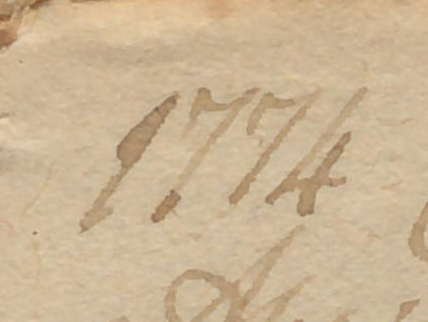1774
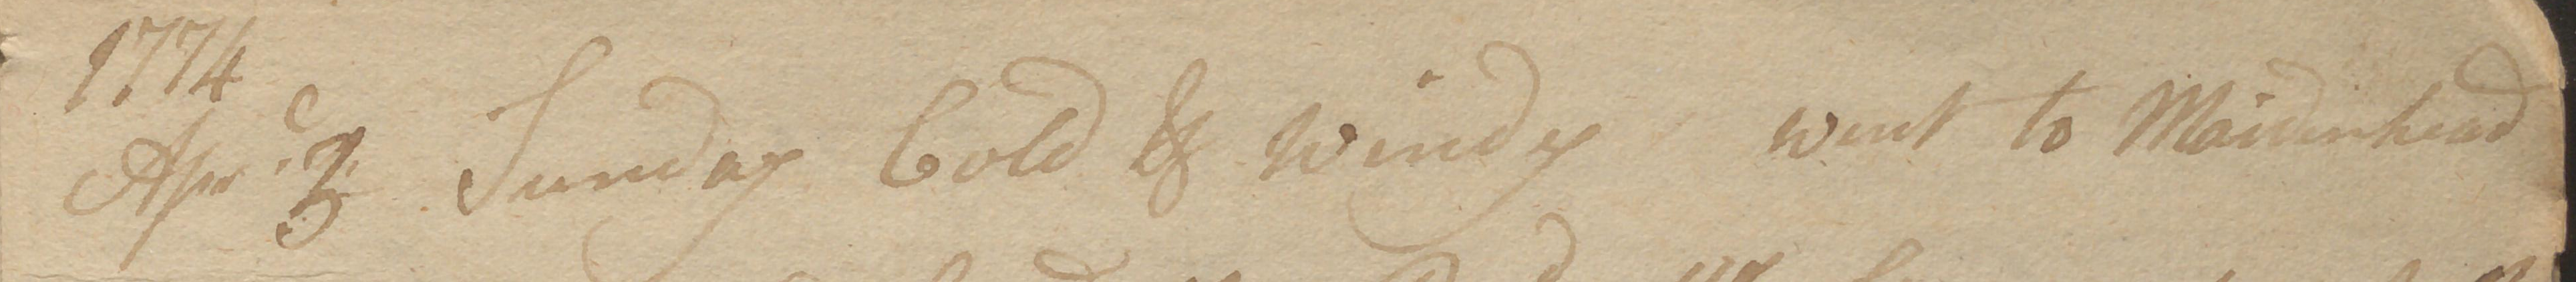Apr^l. 3 Sunday Cold & windy went to Maidenhead
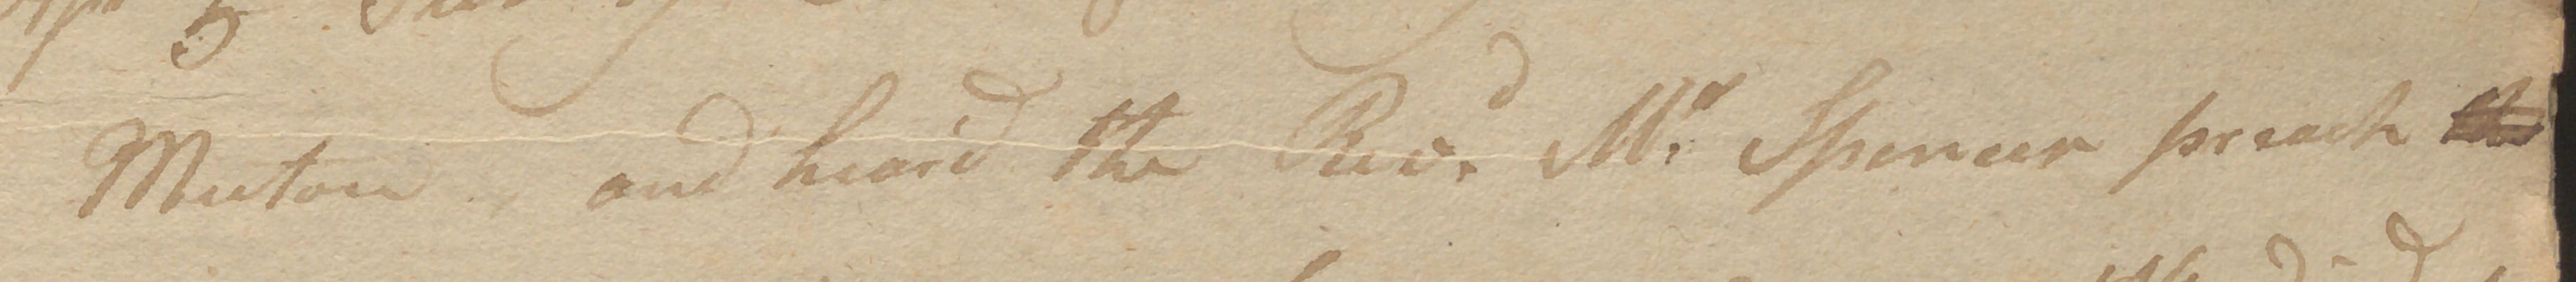Muton, and heard the Rev^d. M^r. Spencer preach [_]
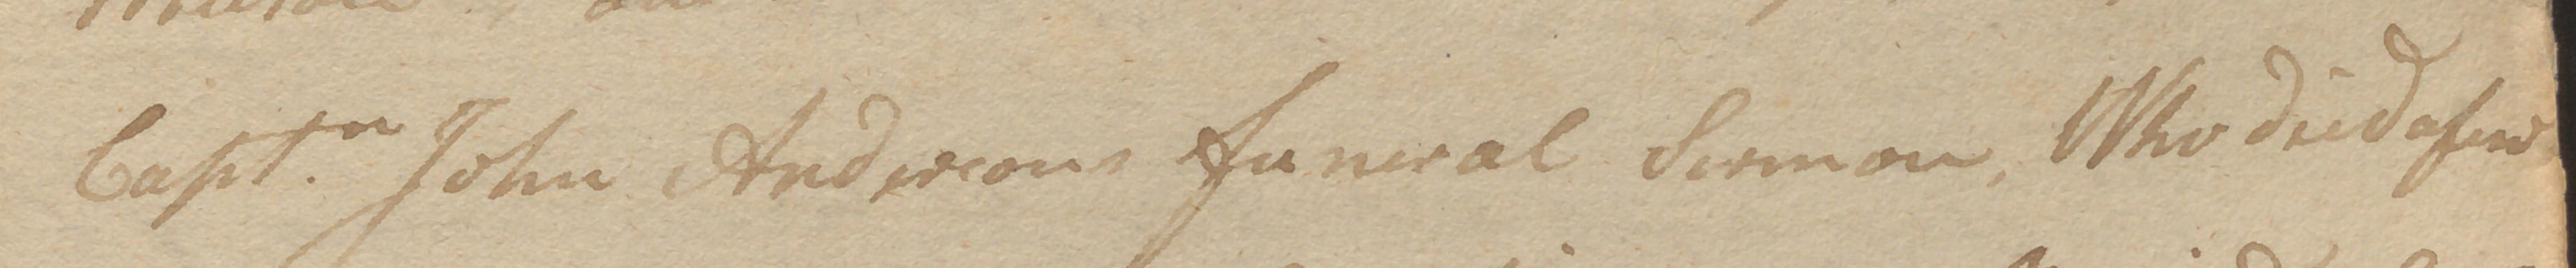Capt^n. John Andersons funeral Sermon, Who died a few
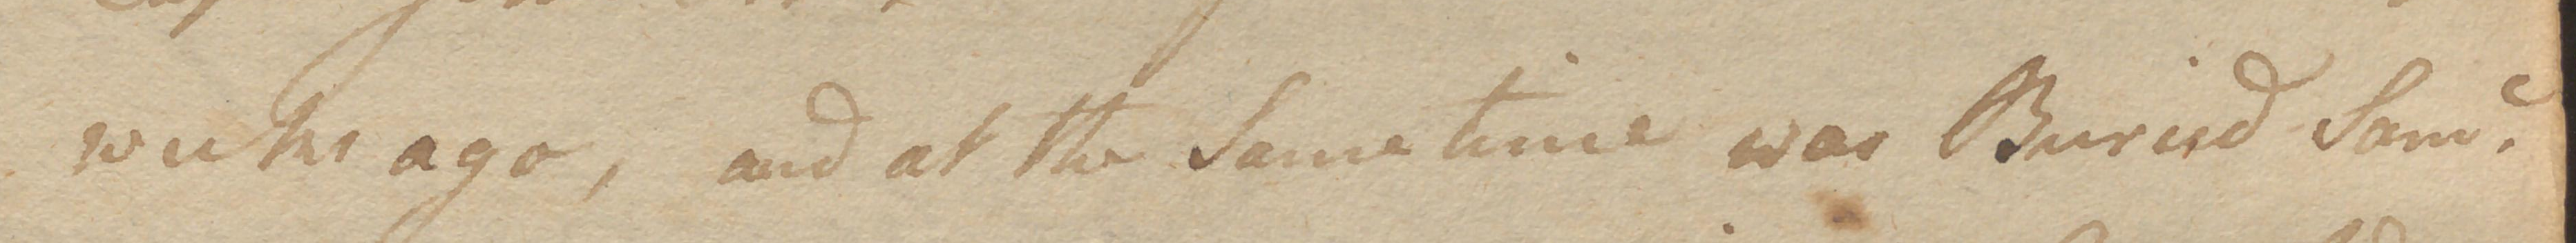weeks ago, and at the Same time was Buried Sam^l.
